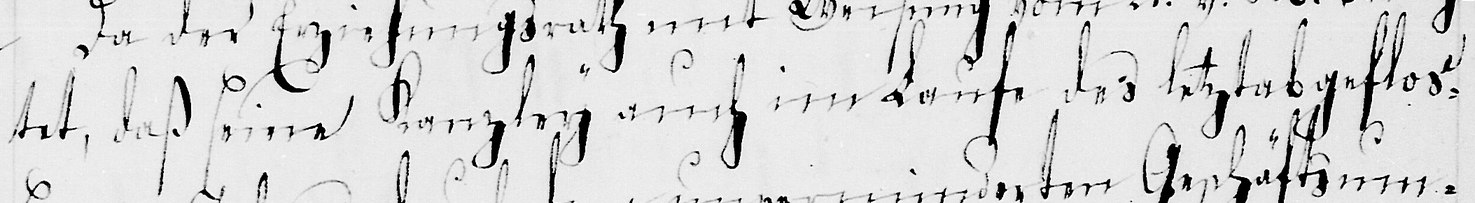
tet, daß seine Kanzley auch im Laufe des letztabgefloß¬
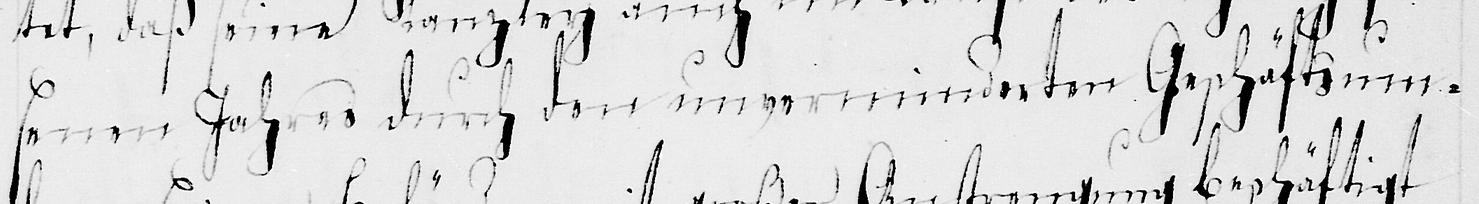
enen Jahres durch den unverminderten Geschäftsum¬
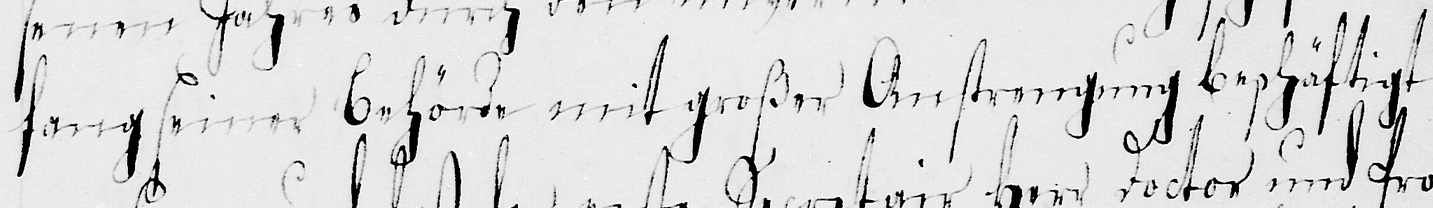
fang seiner Behörde mit großer Anstrengung beschäftigt
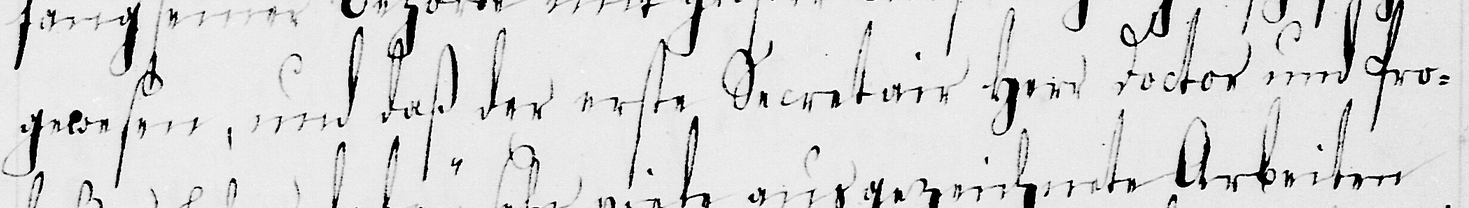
gewesen, und daß der erste Secretair Herr Doctor und Pro¬
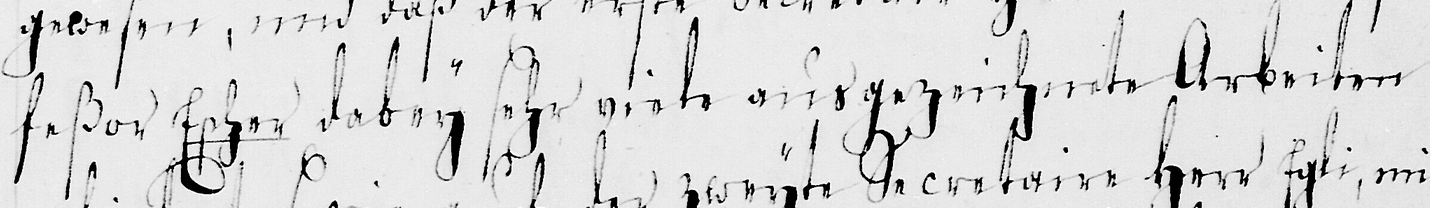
feßor Escher dabey sehr viele ausgezeichnete Arbeiten
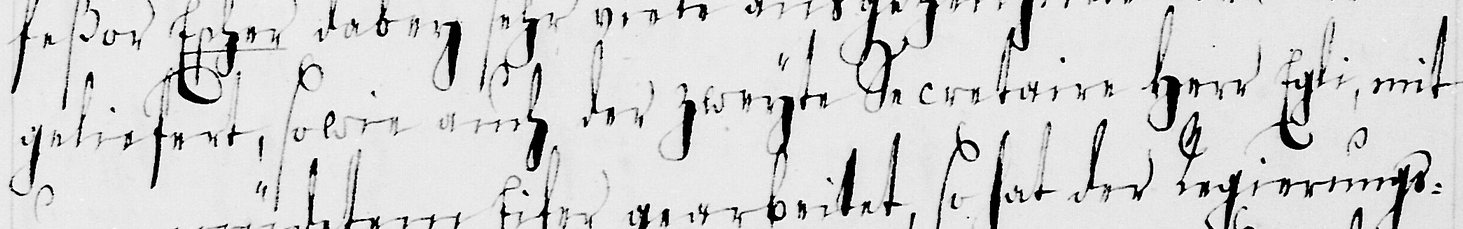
geliefert, sowie auch der zweyte Secretaire Herr Egli, mit
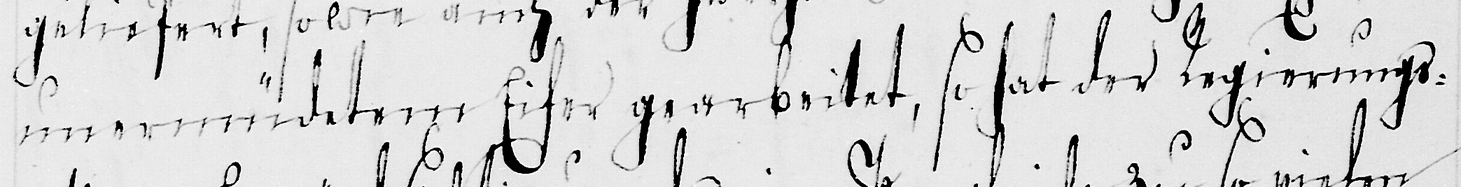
unermüdetem Eifer gearbeitet, so hat der Regierungs¬
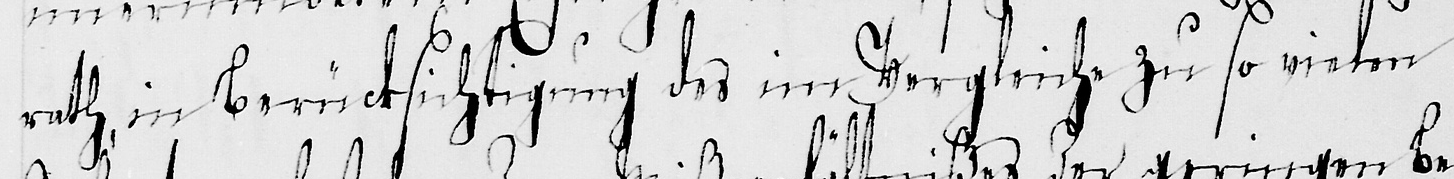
rath, in Berücksichtigung des im Vergleiche zu so vielen
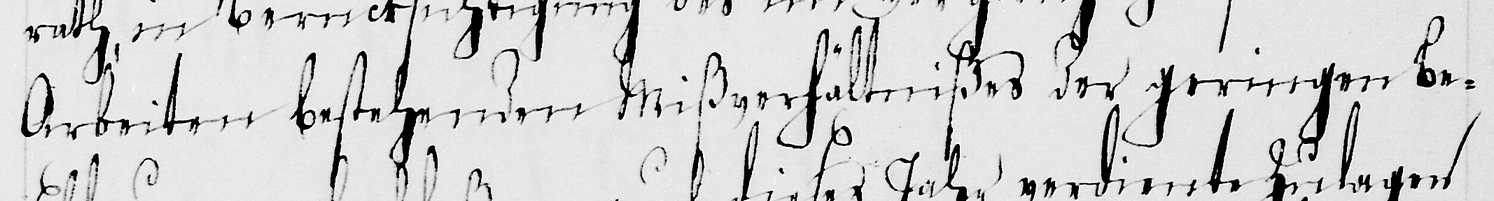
Arbeiten bestehenden Mißverhältnißes der geringen Be¬
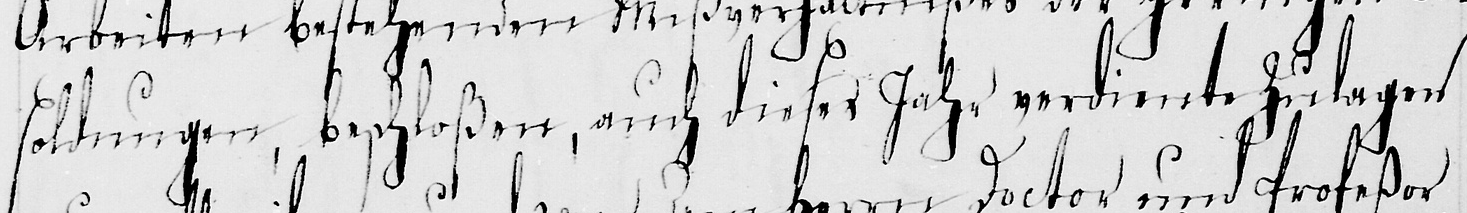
soldungen, beschloßen, auch dieses Jahr verdiente Zulagen
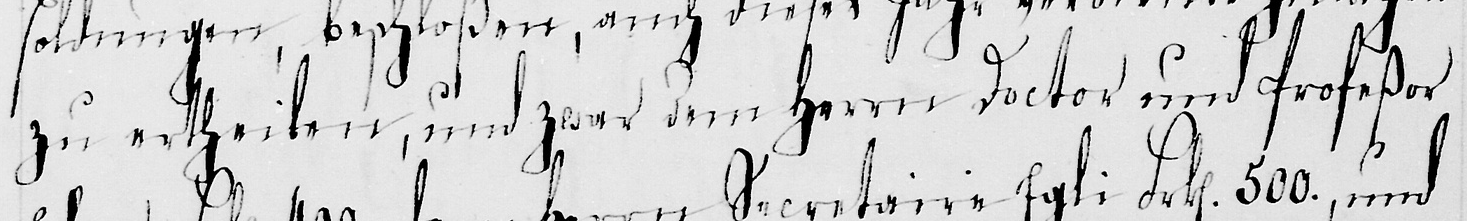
zu ertheilen, und zwar dem Herrn Doctor und Profeßor
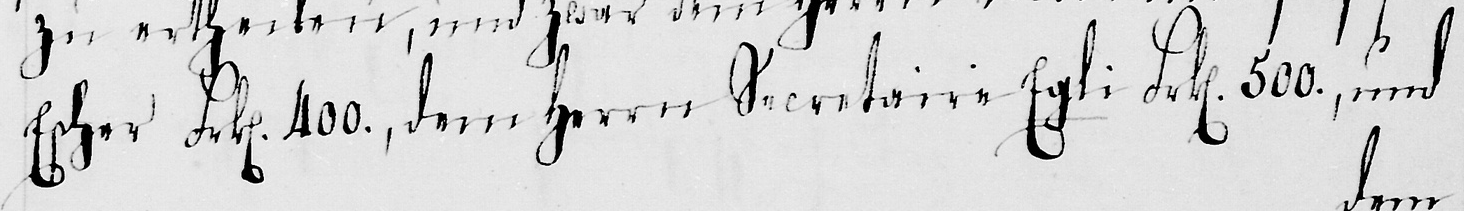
Escher Frk[en]. 400., dem Herrn Secretaire Egli Frk[en]. 500., und
